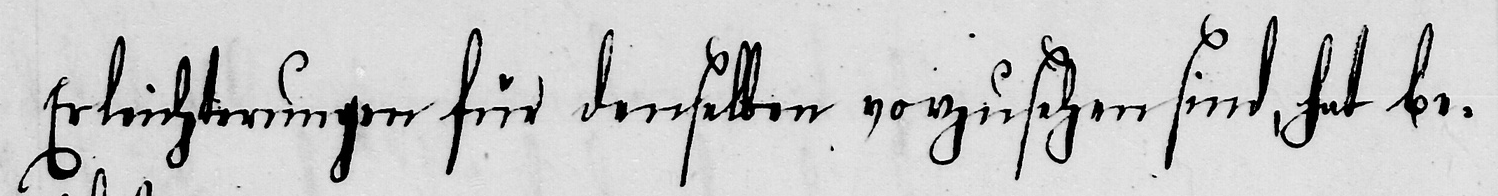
Erleichterungen für denselben vorzusehen sind, hat be¬
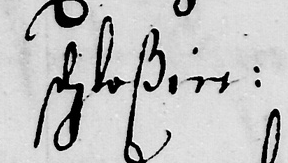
schloßen:
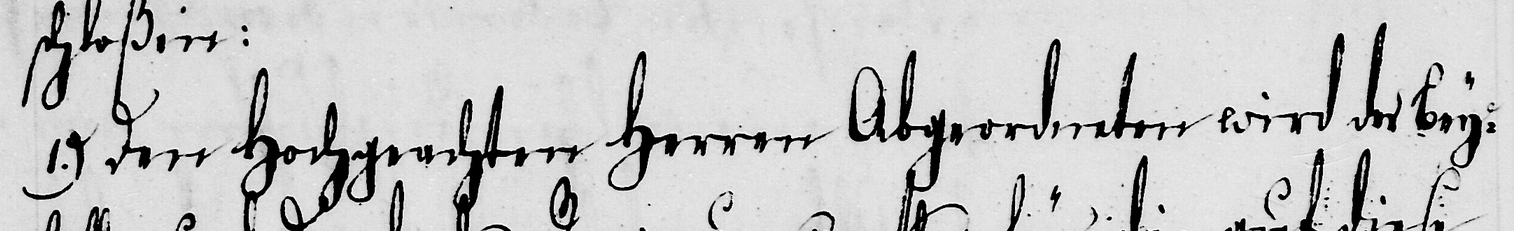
1.) Den Hochgeachteten Herren Abgeordneten wird der Bey¬
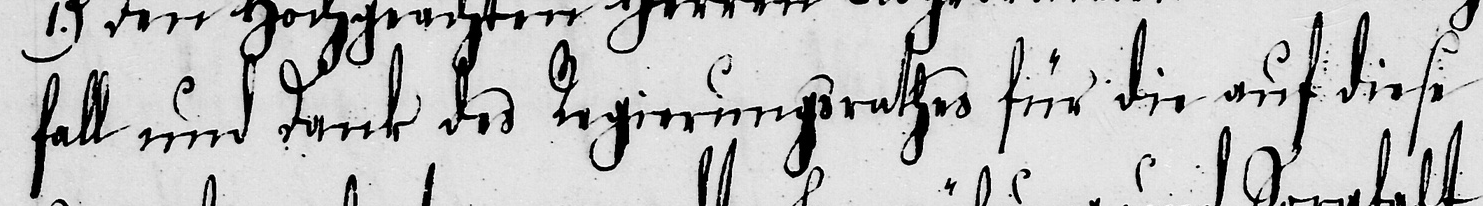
fall und Dank des Regierungsrathes für die auf diese
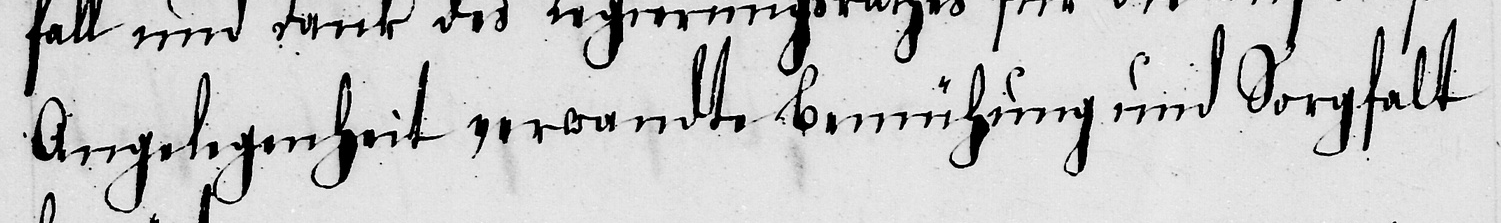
Angelegenheit verwandte Bemühung und Sorgfalt
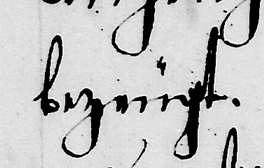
bezeugt.
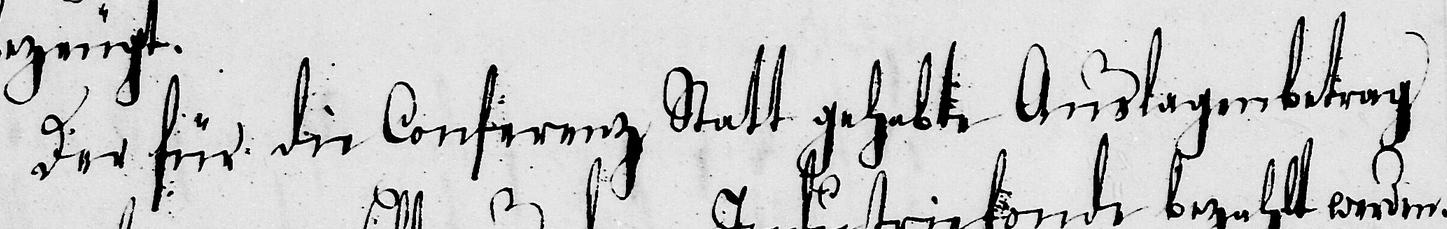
Der für die Conferenz Statt gehabte Auslagenbetrag
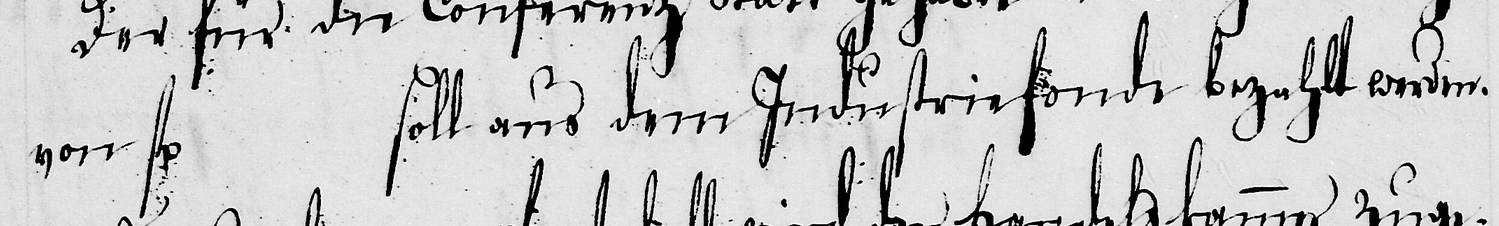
von fl. [...] soll aus dem Industriefonde bezahlt werde¬
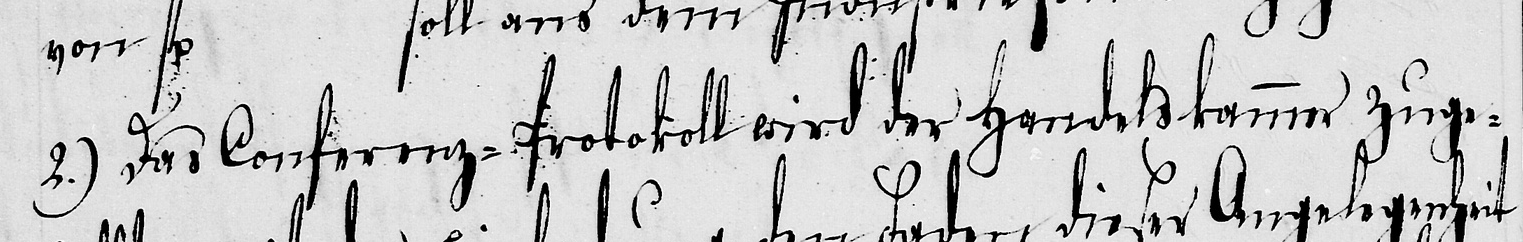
2.) Das Conferenz-Protokoll wird der Handelskammer zuges¬
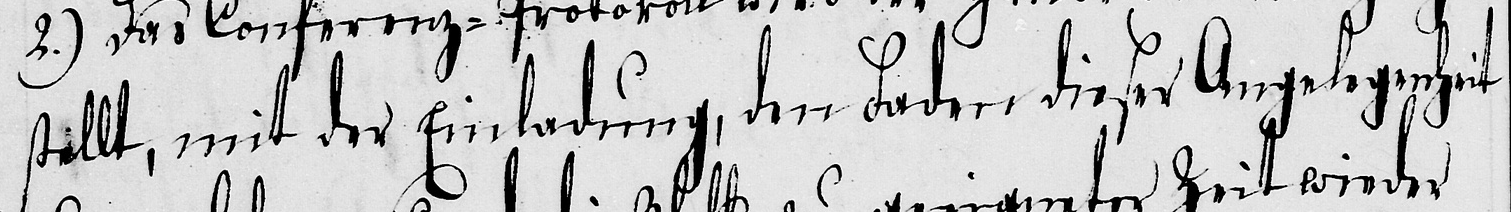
tellt, mit der Einladung, den Faden dieser Angelegenheit
